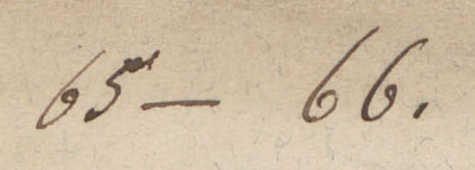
65 – 66.
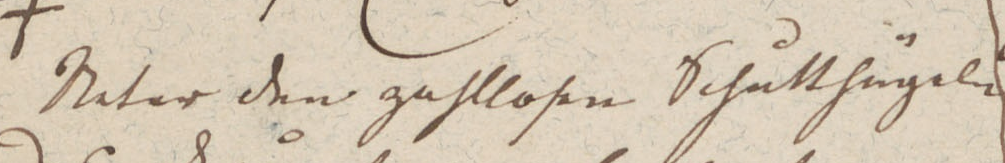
% Unter den zahllosen Schutthügeln
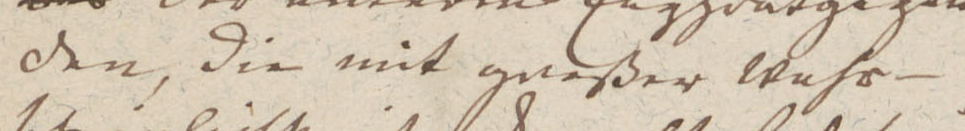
den, die mit grosser Wahr-
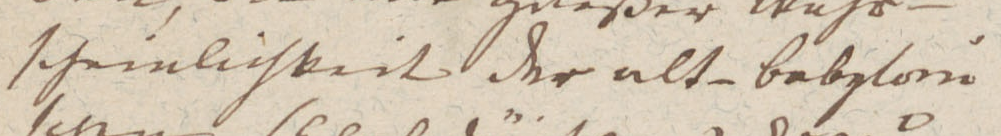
scheinlichkeit der alt-babyloni
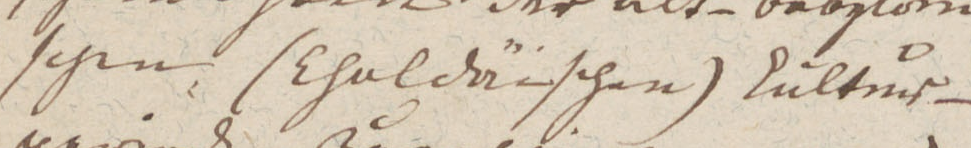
schen (Chaldäischen) Cultur-
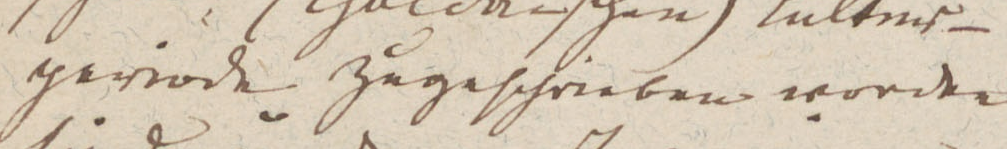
periode ugeschrieben worden
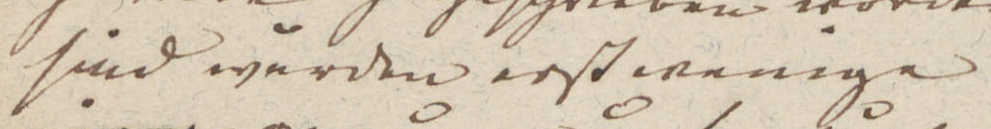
sind wurden erst wenige
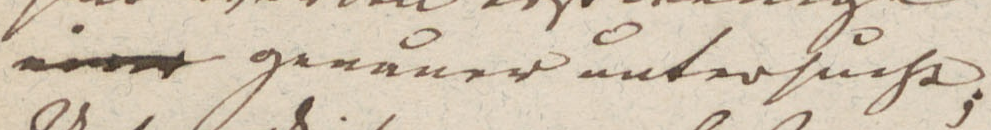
einer genauer untersucht;
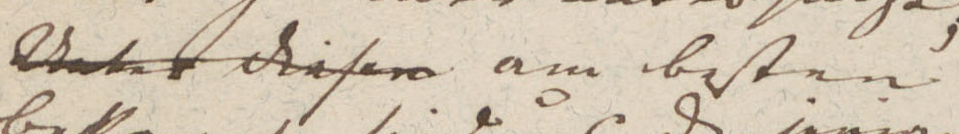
Unter diesen am besten
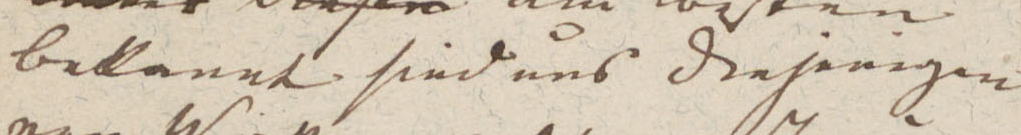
bekannt sind uns diejenigen
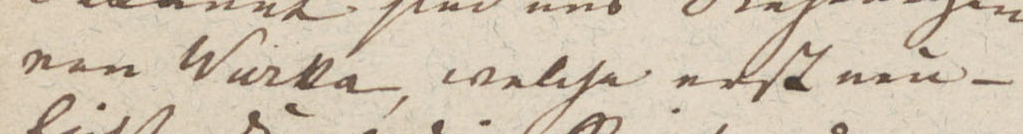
von Wurka, welche erst neu-
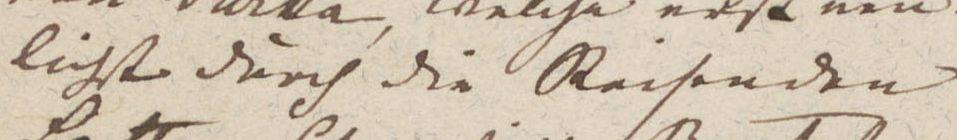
lichst durch die Reisenden
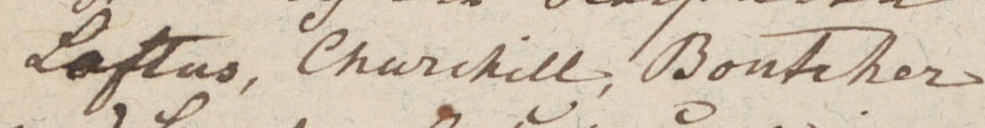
Loftus, Churchill, Boutcher
